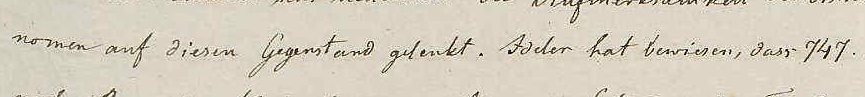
nomen auf diesen Gegenstand gelenkt. Ideler hat bewiesen, dass 747
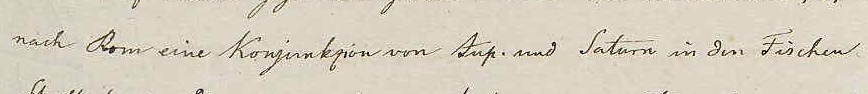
nach Rom eine Konjunkzion von Jup. und Saturn in den Fischen
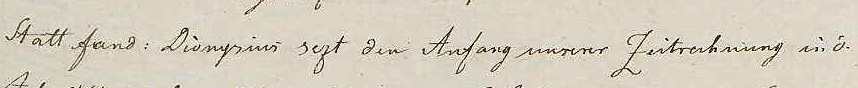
Statt fand: Dionysius sezt den Anfang unserer Zeitrechnung in d.
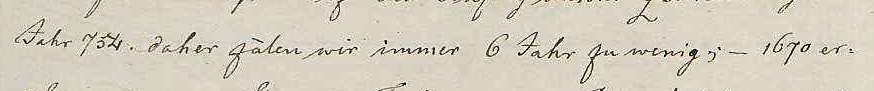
Jahr 754. daher zälen wir immer 6 Jahr zu wenig; – 1670 er-
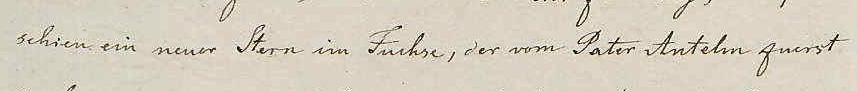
schien ein neuer Stern im Fuchse, der vom Pater Antelm zuerst
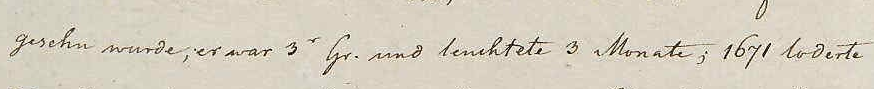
gesehn wurde, er war 3￼ Gr. und leuchtete 3 Monate; 1671 loderte
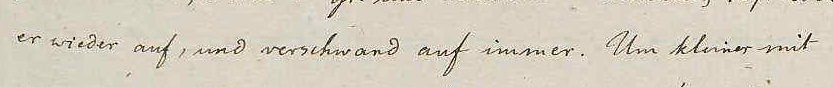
er wieder auf, und verschwand auf immer. Um kleines mit
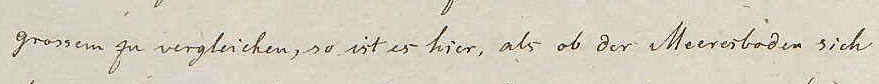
grossem zu vergleichen, so ist es hier, als ob der Meeresboden sich
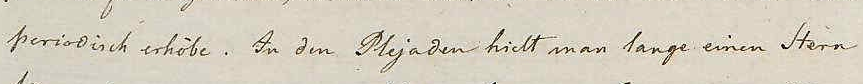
periodisch erhöbe. In den Plejaden hielt man lange einen Stern
